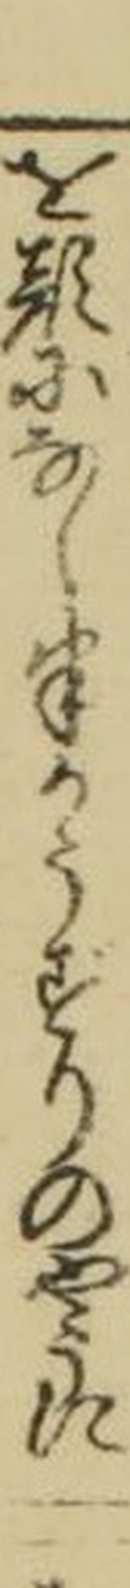を顔になし半かうずりのやうに
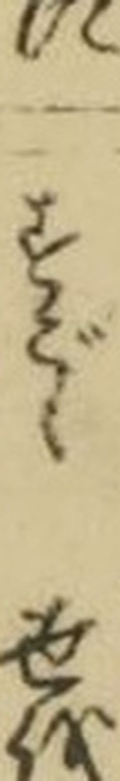すごし
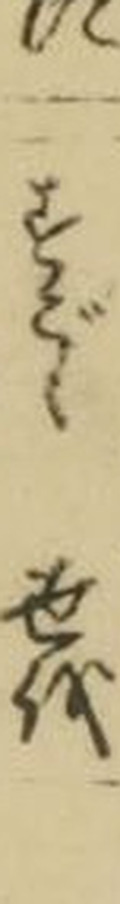すごし
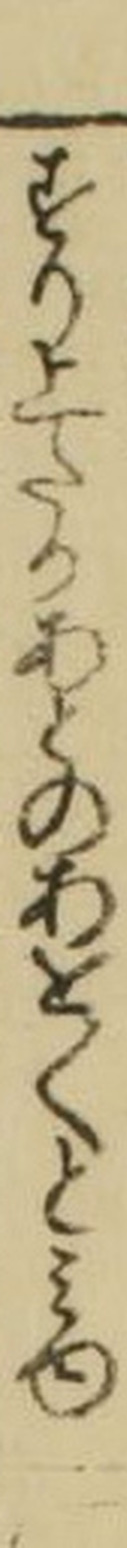すり上たりあとのあを〳〵とみゆ
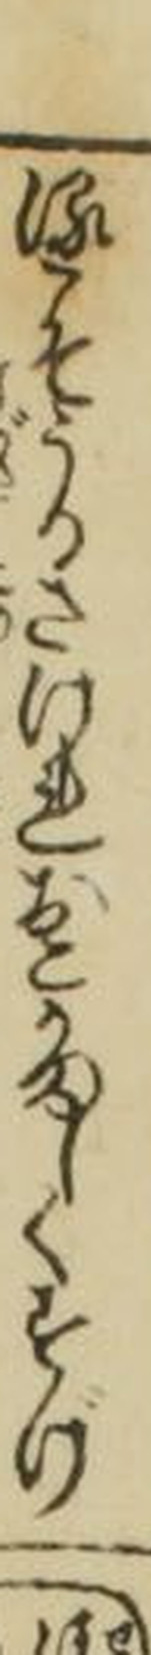るそうるさけれおこがましくすげ
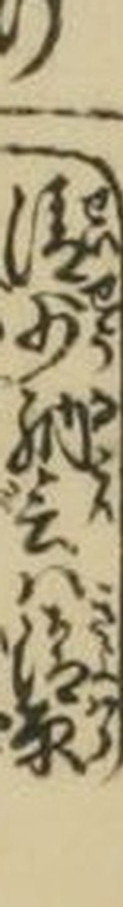清少納云は清原
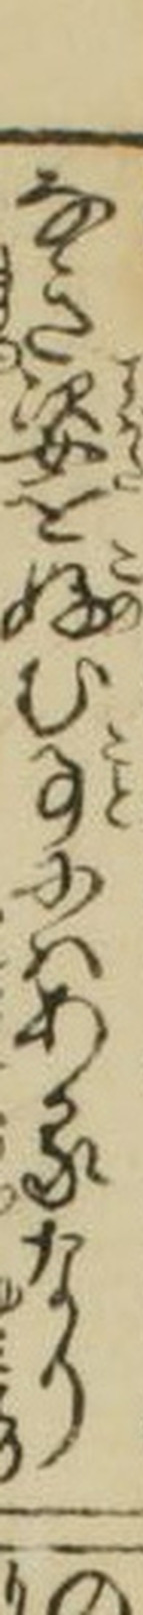なき姿を好む事にはあるなり
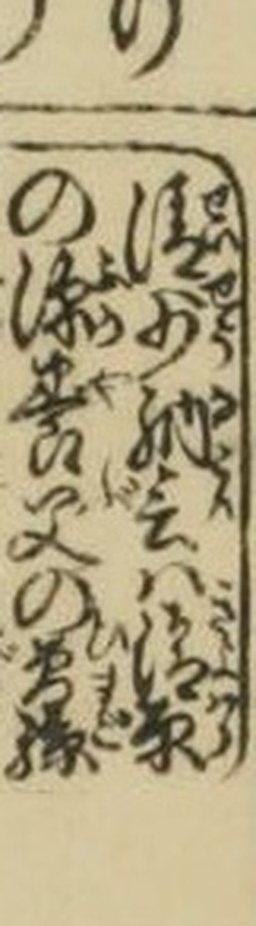の深養父の曾孫
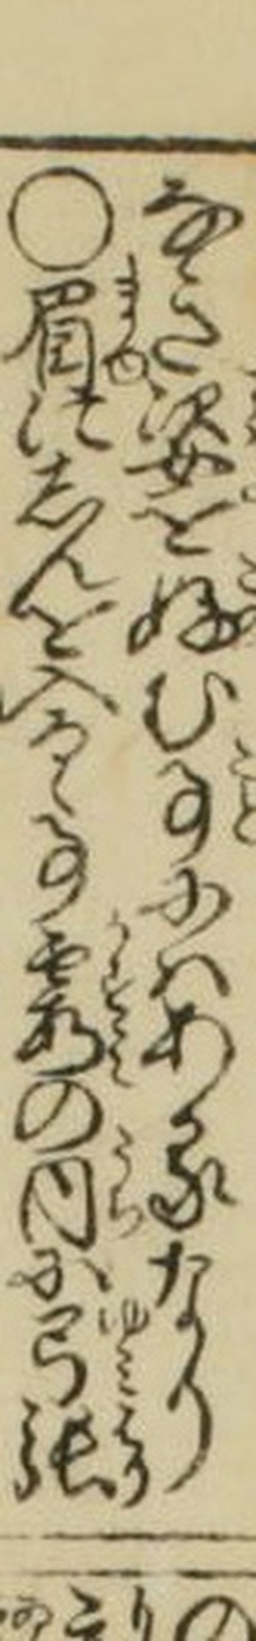◯眉にしんを入るゝ事霞の内に弓張
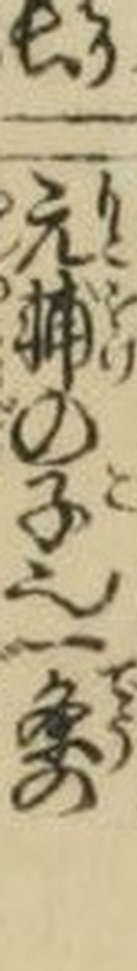元輔の子也一条の
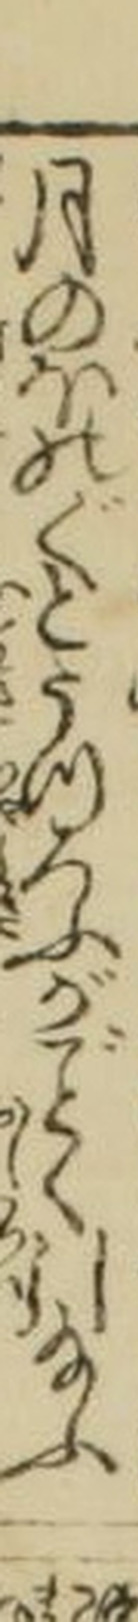月のほの〴〵とうつろふがごとく引給ふ
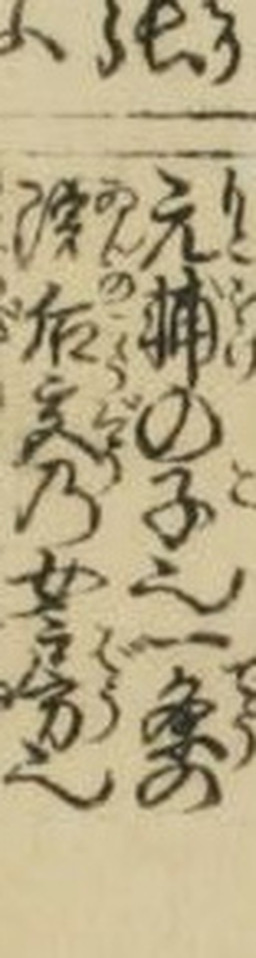院后宮の女房也
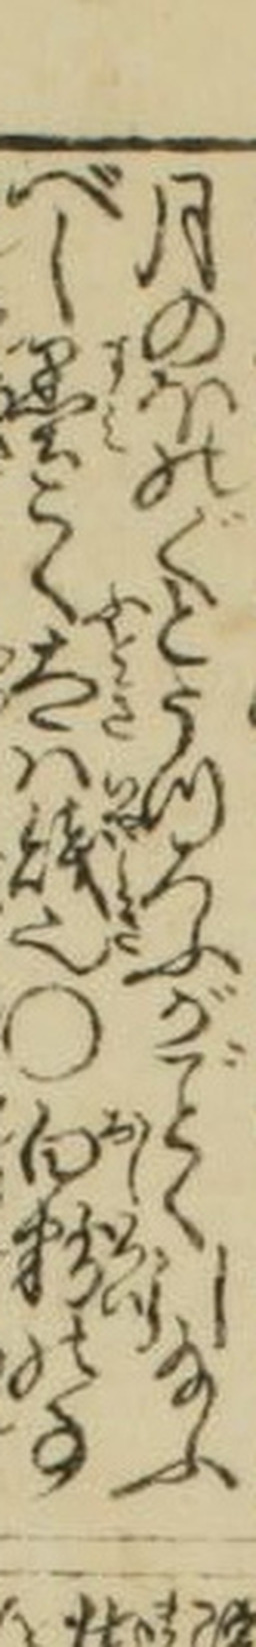べし墨こく太は賤也◯白粉の事
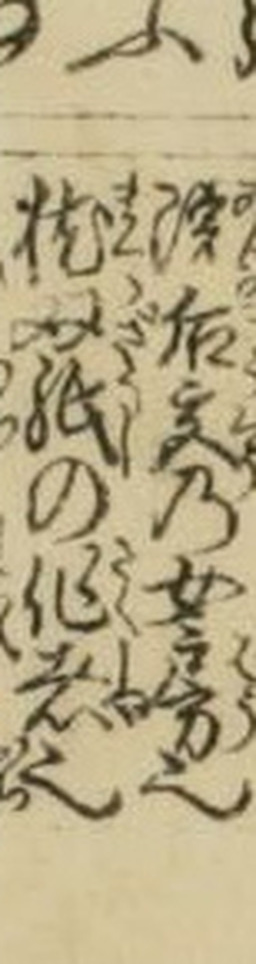枕双紙の作者也
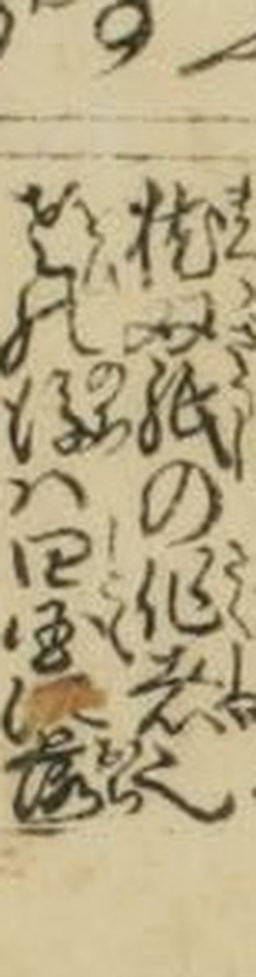老の後は四国に落
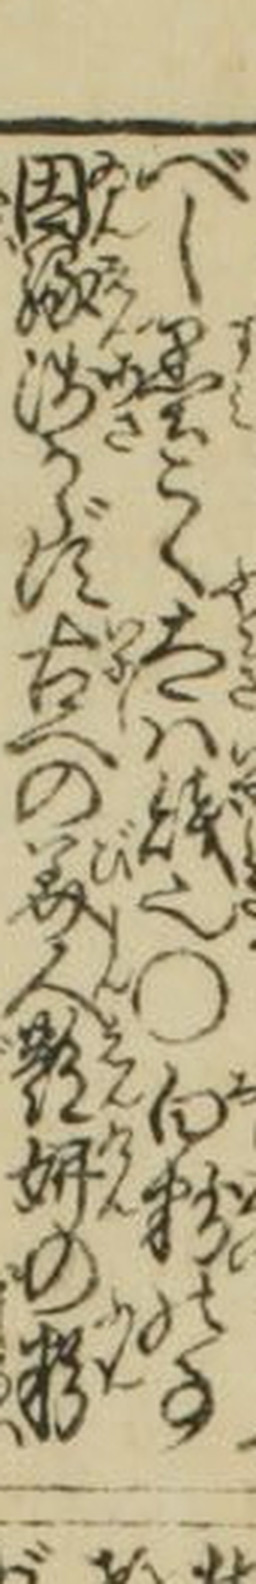因縁淺からず古への美人艶妍の粉
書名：女源氏教訓鑑
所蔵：東京学芸大学附属図書館
